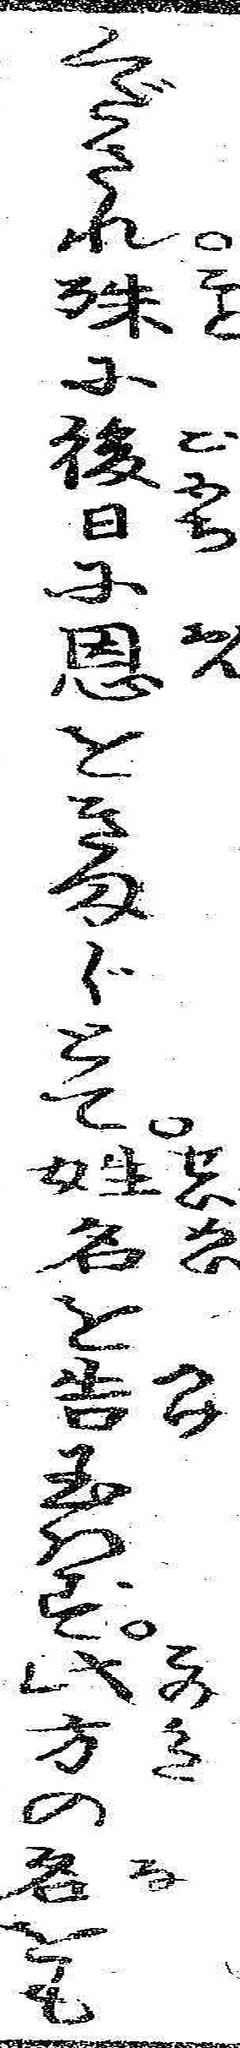くだされ。殊に後日に恩をきまじとて。姓名を告玉はず。此方の名をも
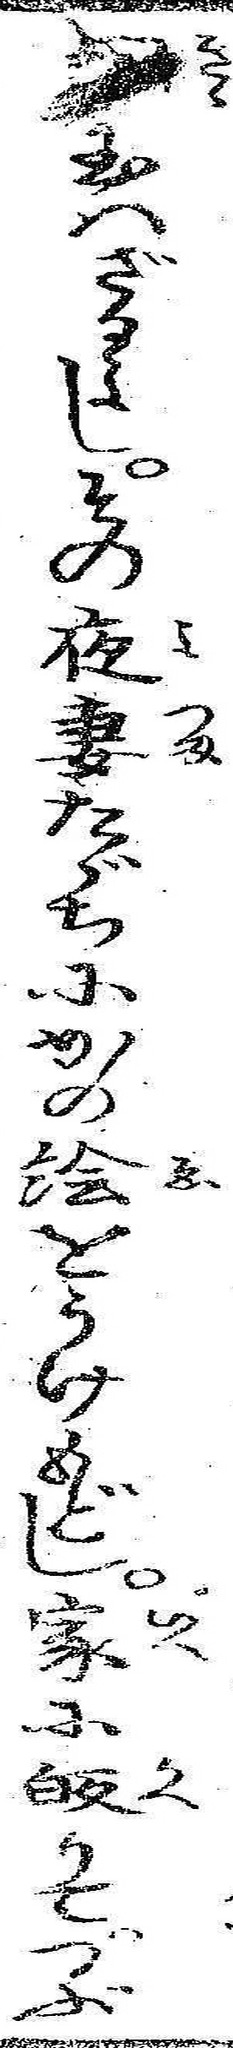聞玉はざるよし。その夜妻たゞちにかの絵をうけもどし。家に帰りて。つぶ
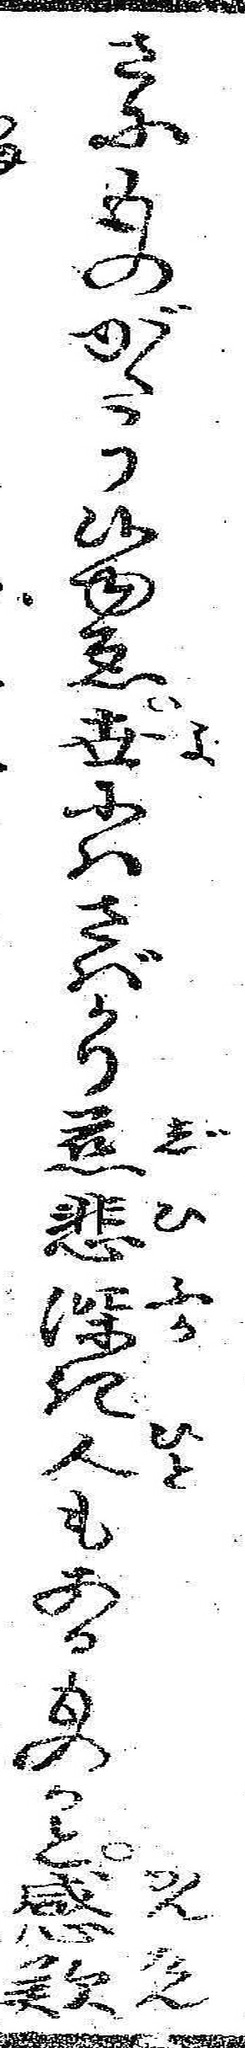さにものがたり候ゆゑ。世にはさばかり慈悲深き人もあるものかと。感歎
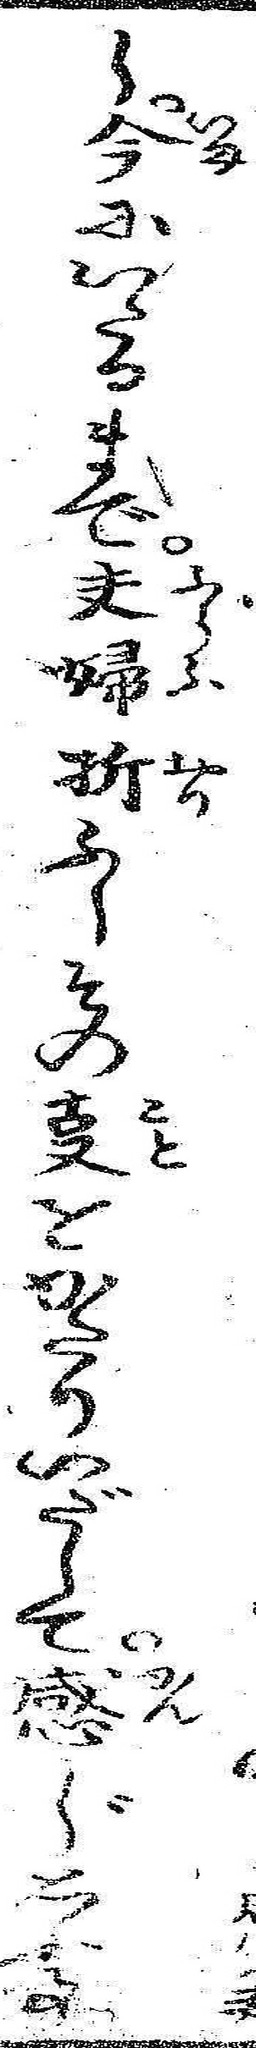し。今にいたるまで。夫婦折ふしその事をかたりいだして。感じ思ふ事
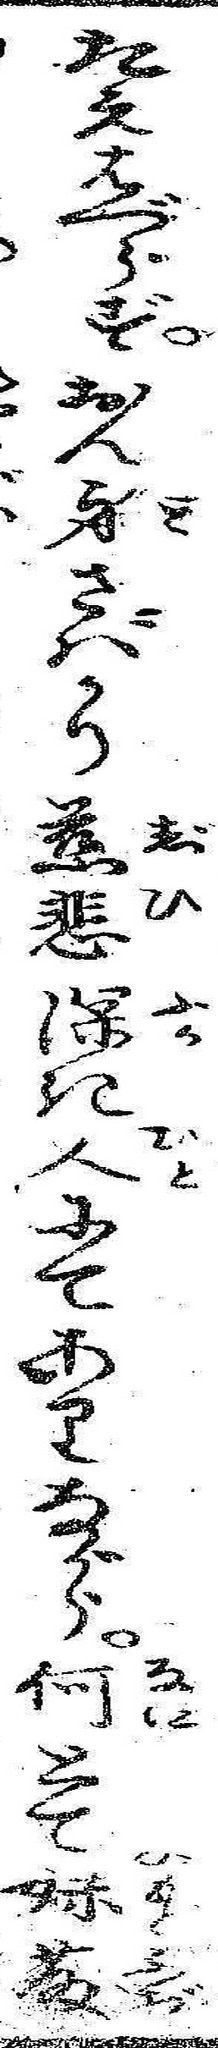たえはべらず。おん身さばかり慈悲深き人にてありながら。何とて妹藤
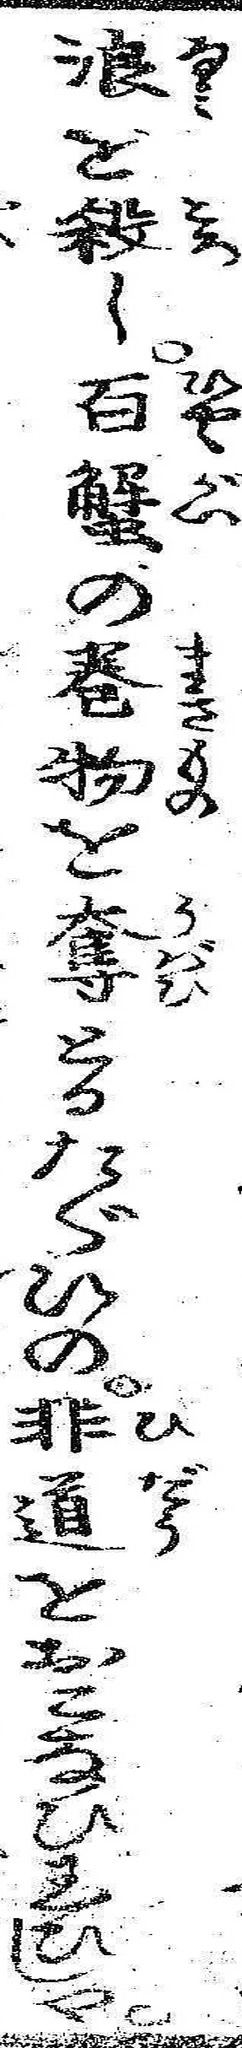浪を殺し。百蟹の巻物を奪とるたぐひの。非道をおこなひ玉ひしや。
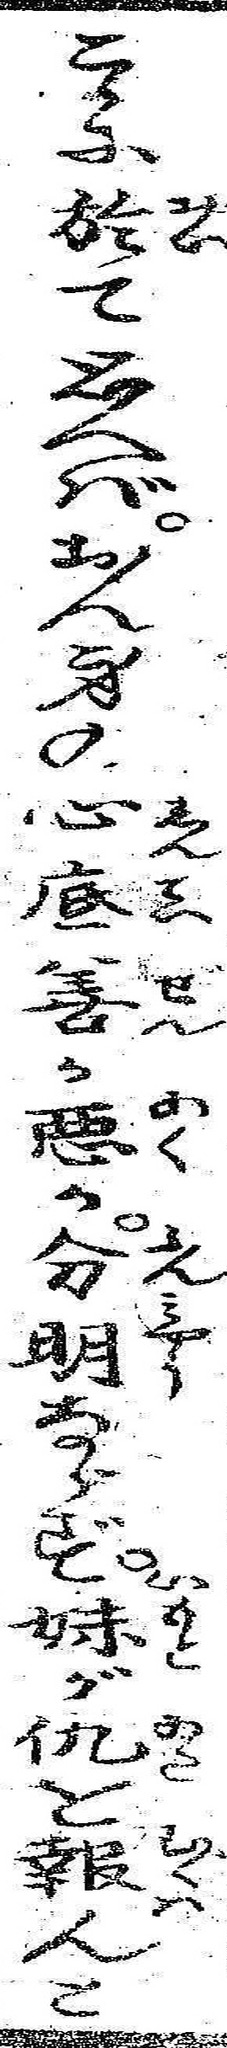こゝに於て思へば。おん身の心底善か悪か。分明ならず。妹が仇を報んと

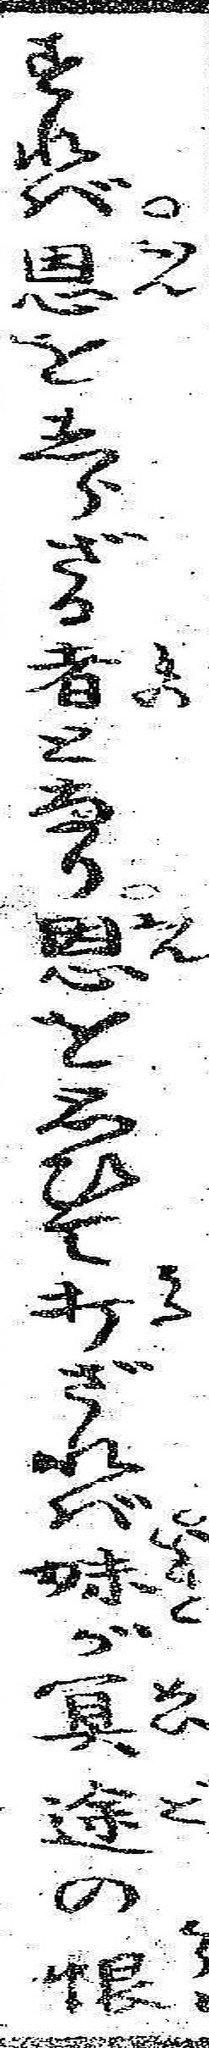すれば。恩をしらざる者となり。恩を思ひて打ざれば。妹が冥途の恨
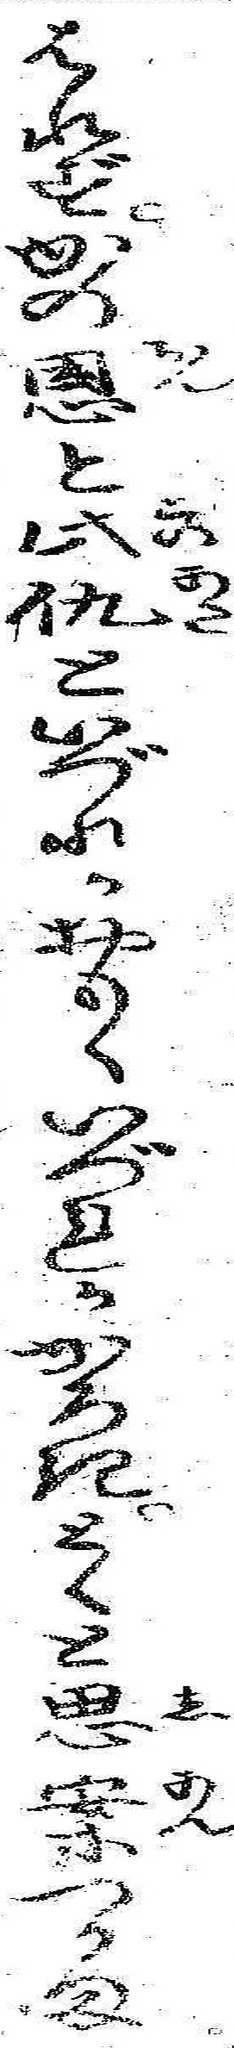はれず。かの恩と此仇といづれかおもくいづれかかろき。とくと思案つかま
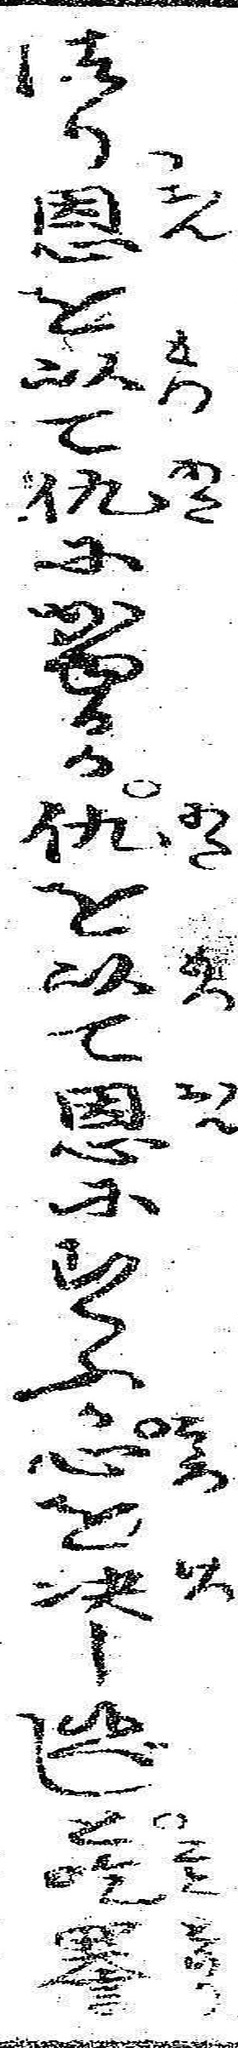つり。恩を以て仇にかゆるか。仇を以て恩にむくふか。心を決し候べしと。吃謇
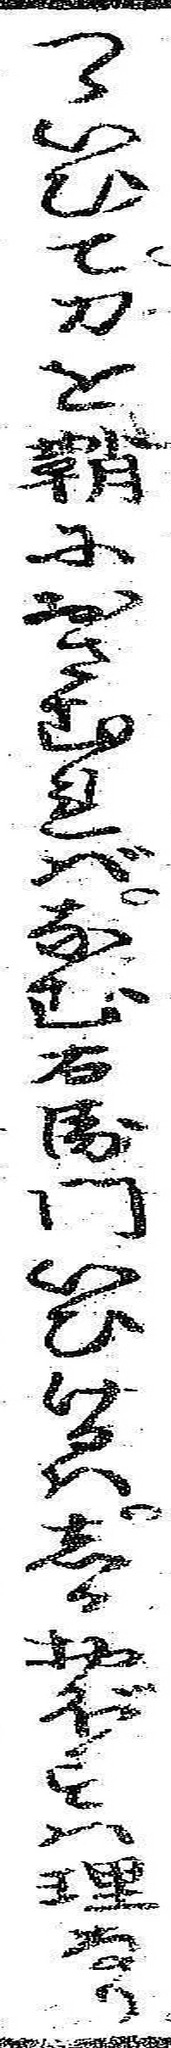つゝいひて。刀を鞘におさむれば。なむ右衛門いひけるは。しかおぼすは理なり。
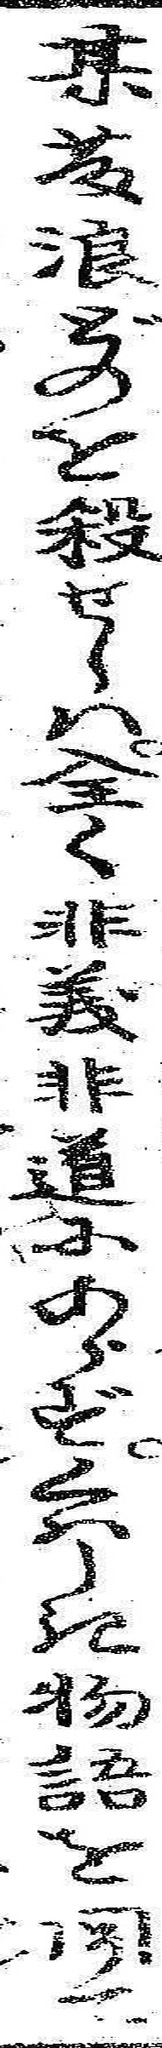某藤浪どのを殺せしは。全く非義非道にあらず。くはしき物語を聞て
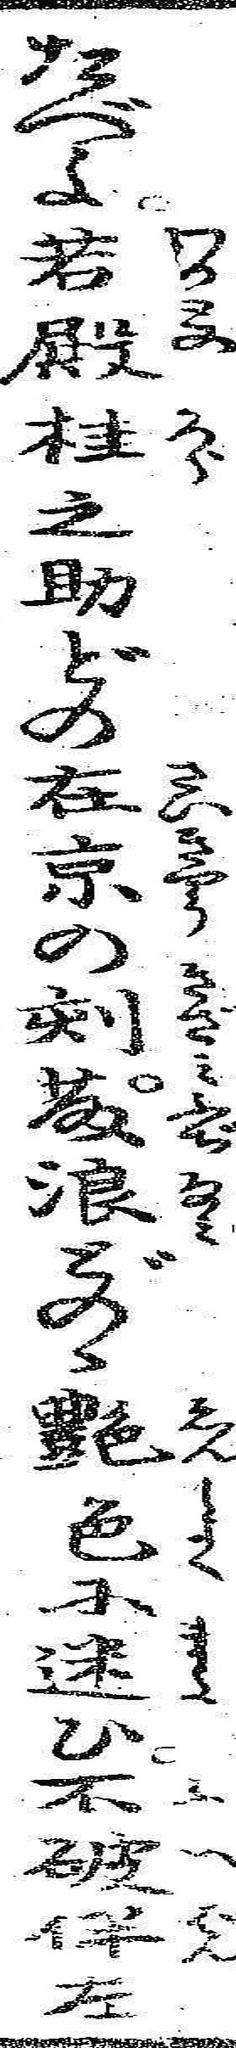たべよ。若殿桂之助どの在京の刻。藤浪どのゝ艶色に迷ひ。不破伴左
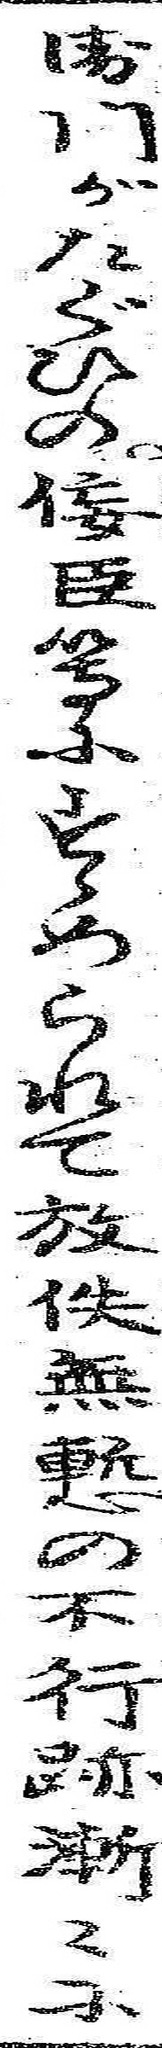衛門がたぐひの。佞臣等にすゝめられて。放佚無慙の不行跡漸々に
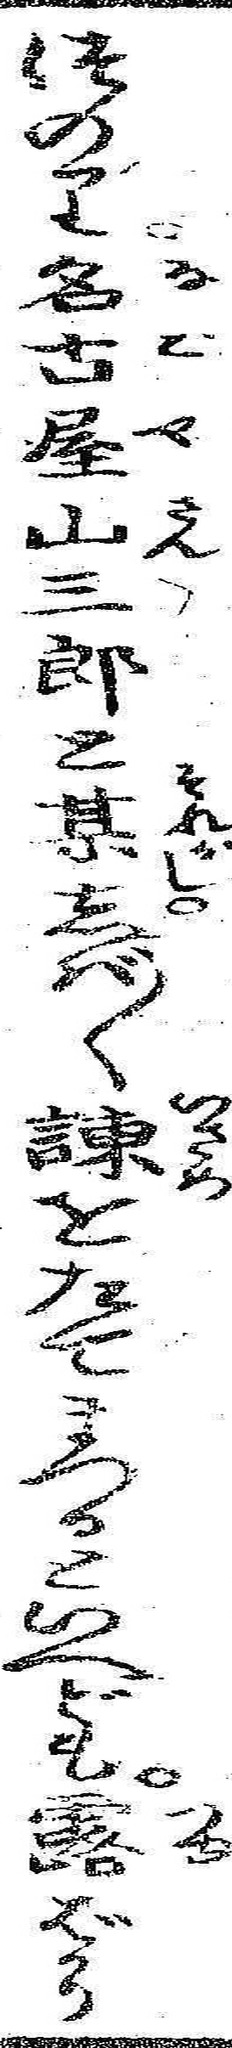つのり。名古屋山三郎と某。しば〳〵諌をたてまつるといへども。露ばかり
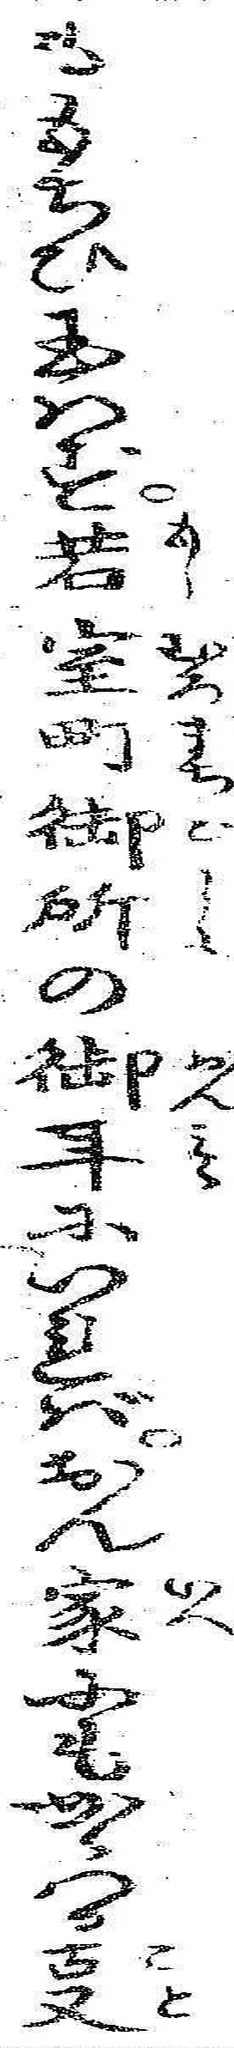ももちひ玉はず。若室町御所の御耳にいれば。おん家にもかゝはる事
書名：昔話稲妻表紙
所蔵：国文学研究資料館
